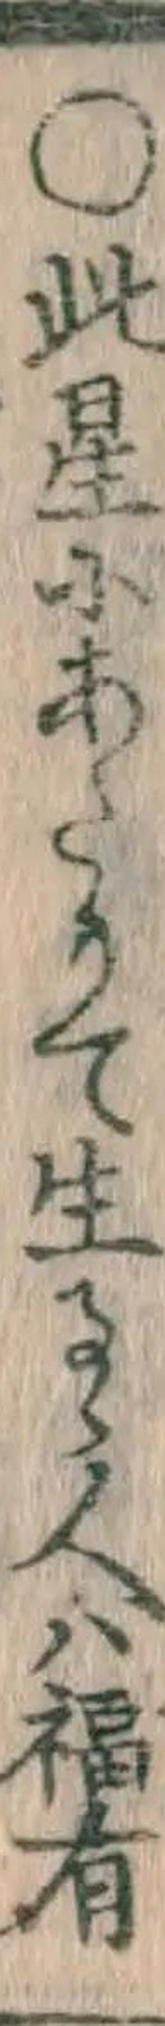○此星にあたりて生るゝ人は福有
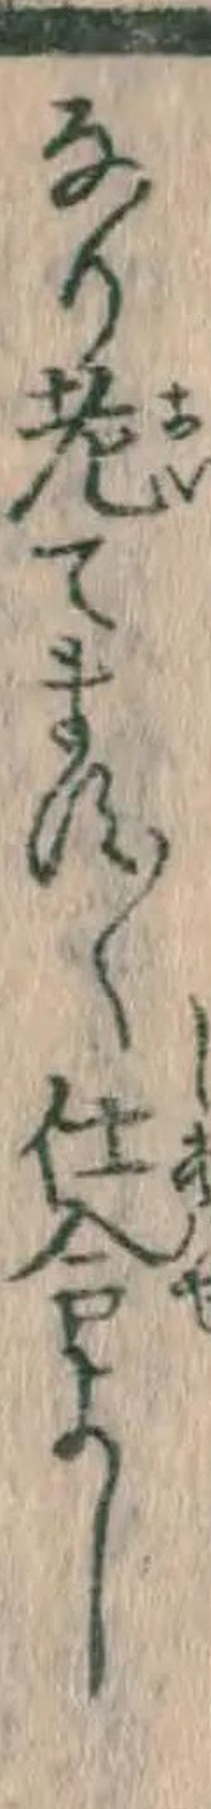なり老てます〳〵仕合よし
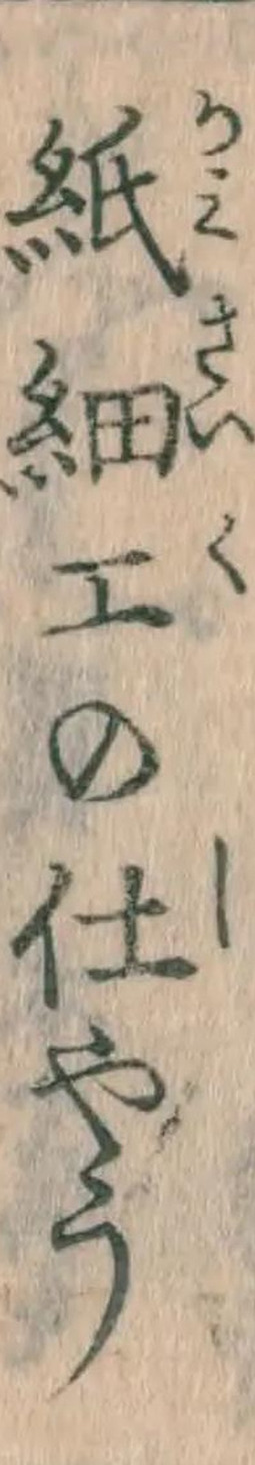紙細工の仕やう
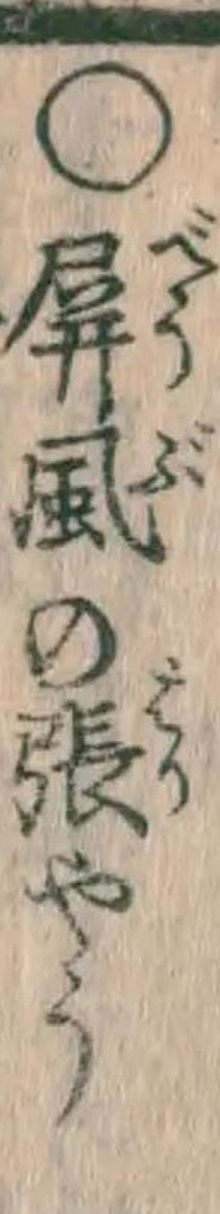○屏風の張やう
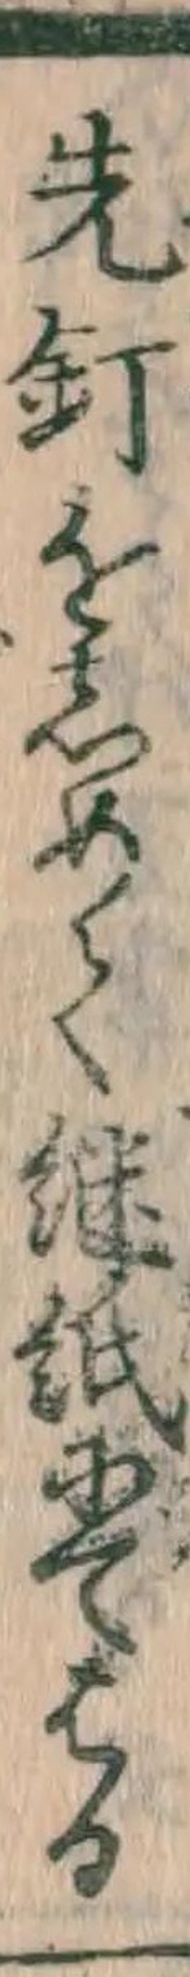先釘をしめて継紙にてはる
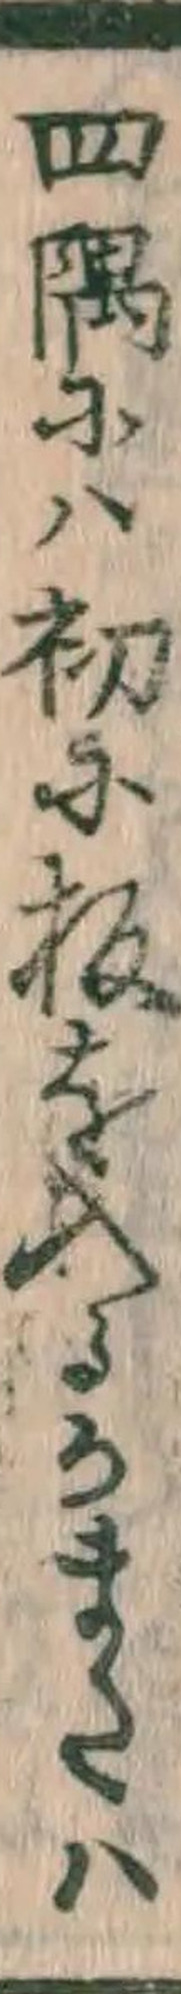四隅には初に板を入るかまたは
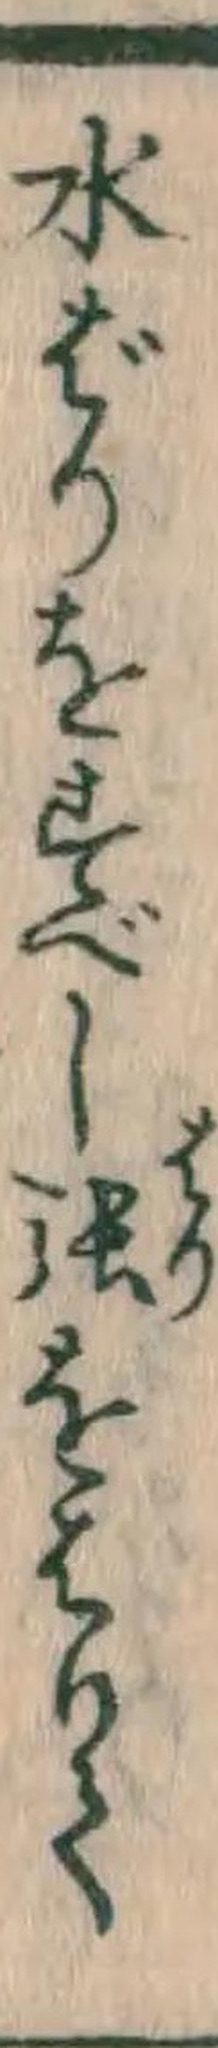水ばりをすべし張をはりて
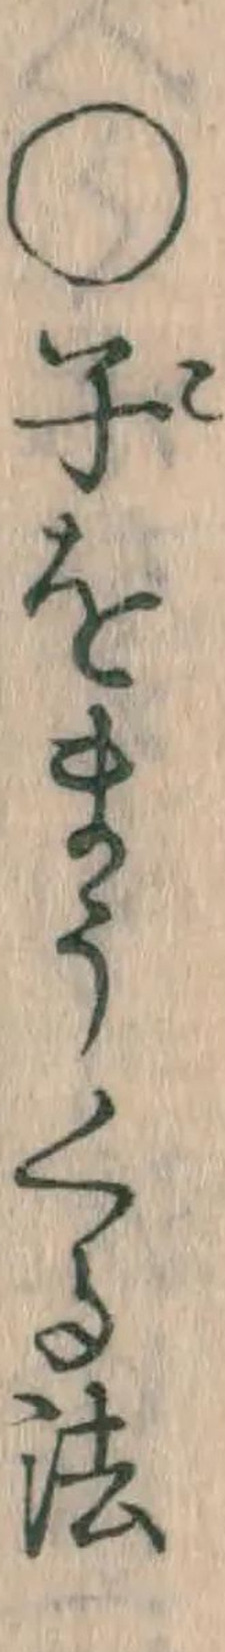○子をまうくる法
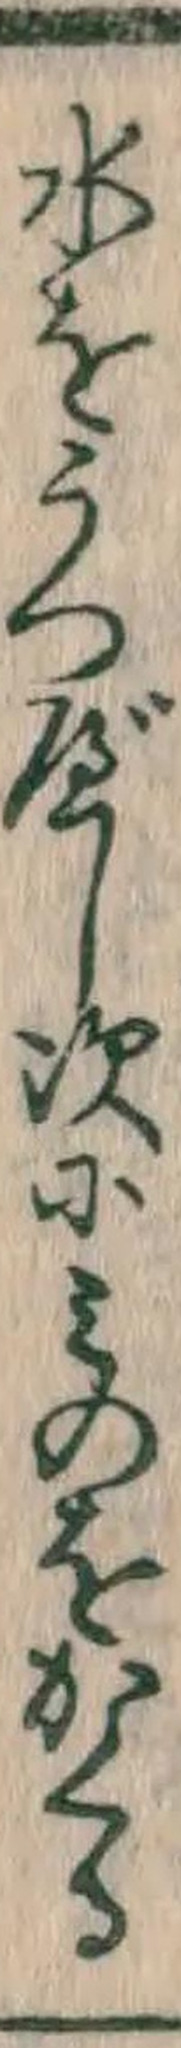水をうつべし次にみのをかくる
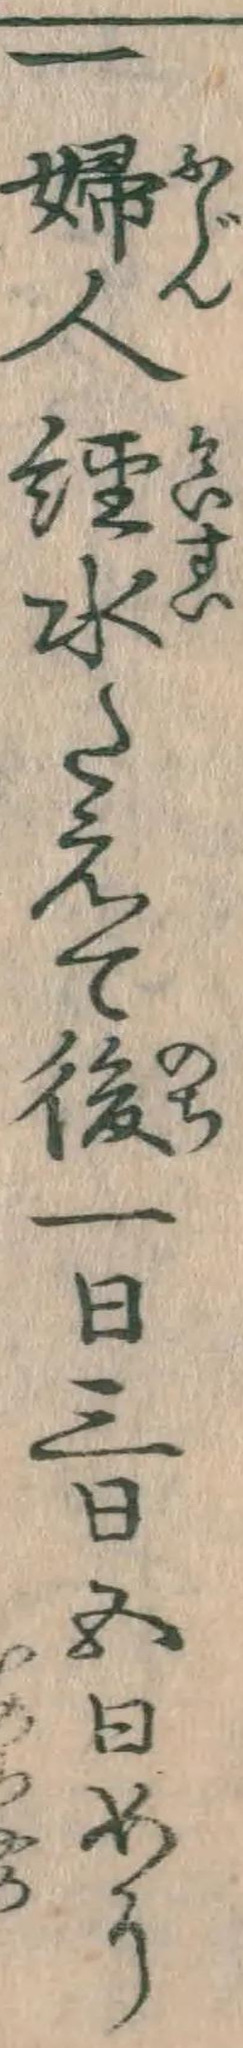一婦人経水たえて後一日三日五日めに
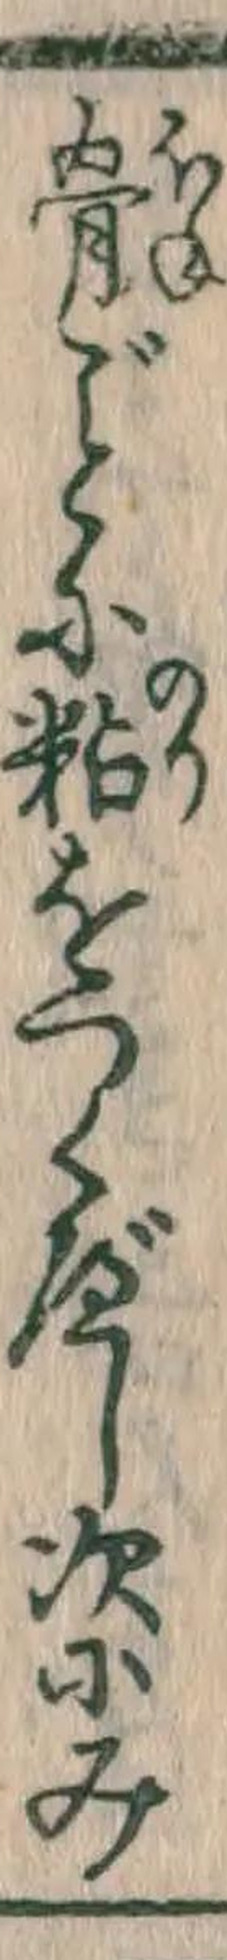骨ごとに粘をつくべし次にみ
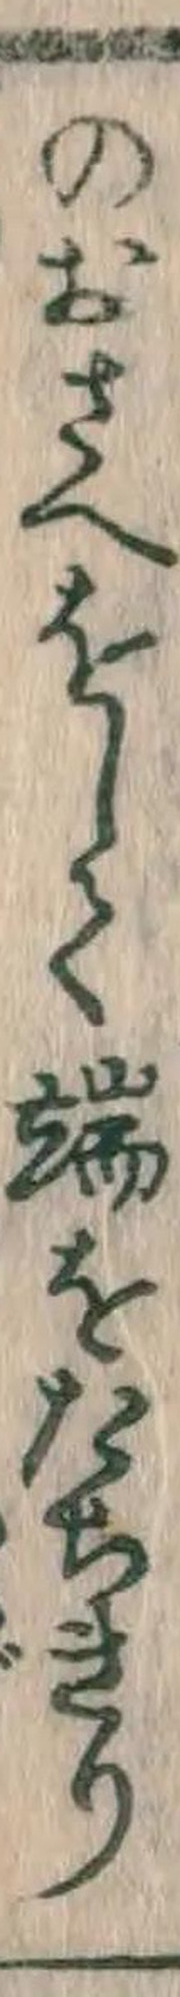のおさへをして端をたちきり
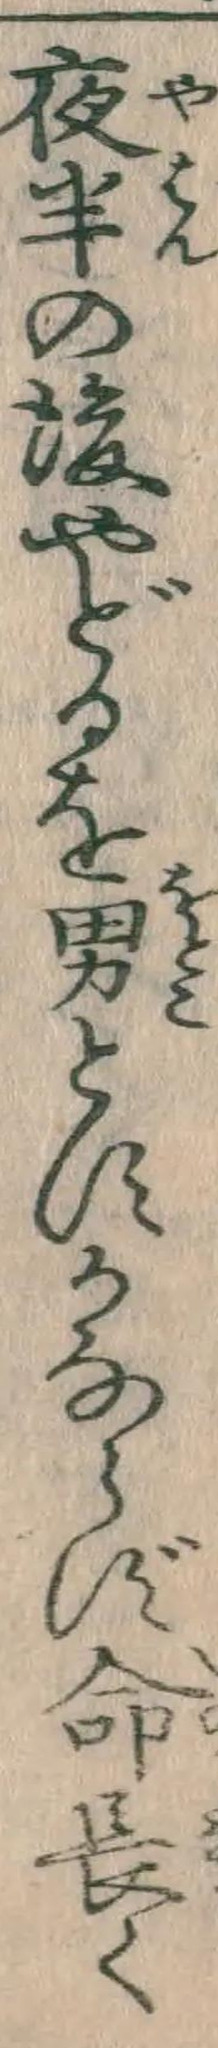夜半の後やどるを男とすかならず命長く
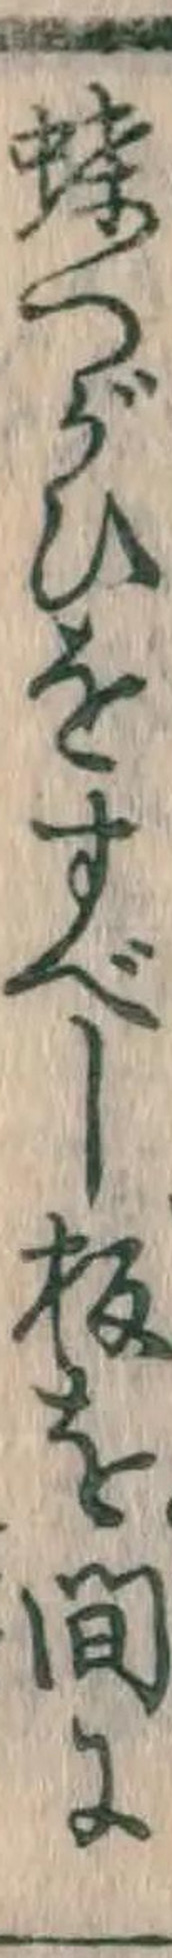蝶つがひをすべし板を間に
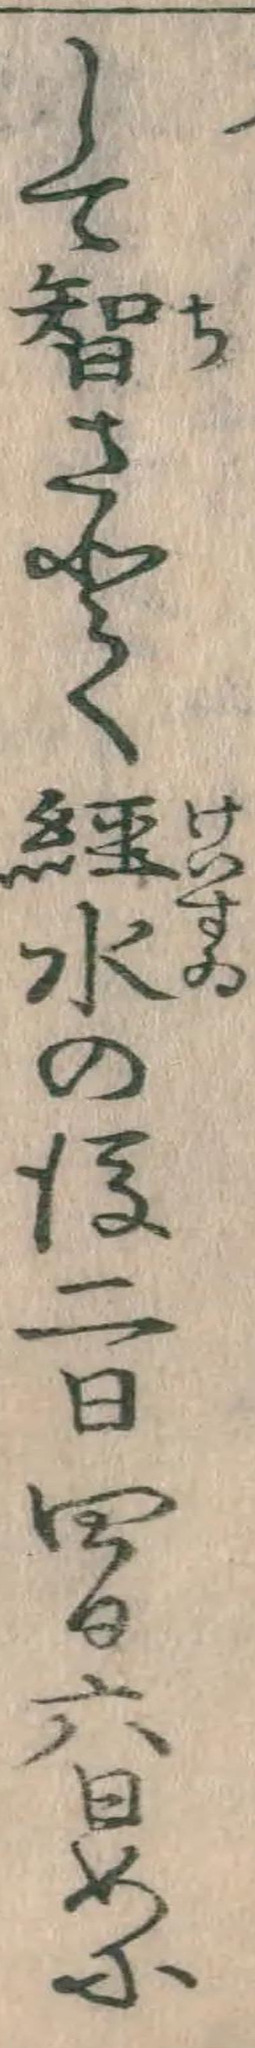して智さとく経水の後二日四日六日めに
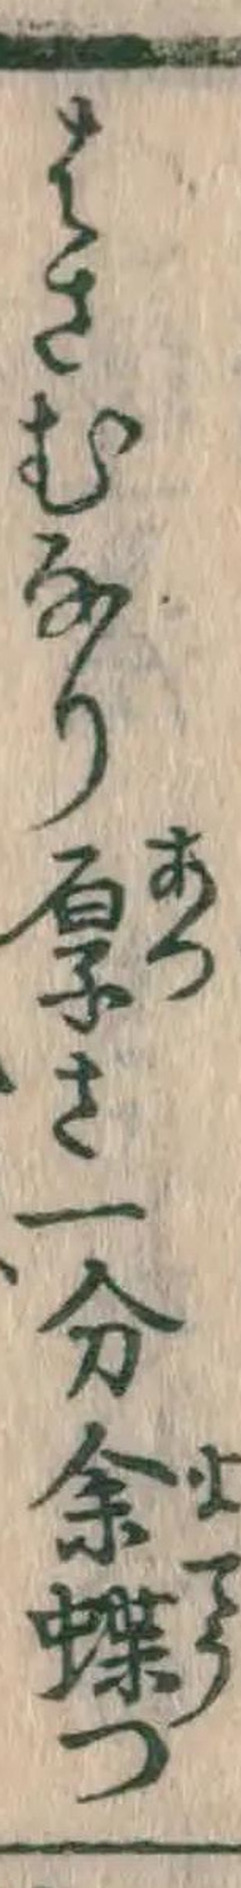はさむなり厚さ一分余蝶つ
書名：広益秘事大全 3巻. [2]
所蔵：国立国会図書館 National Diet Library, JAPAN
